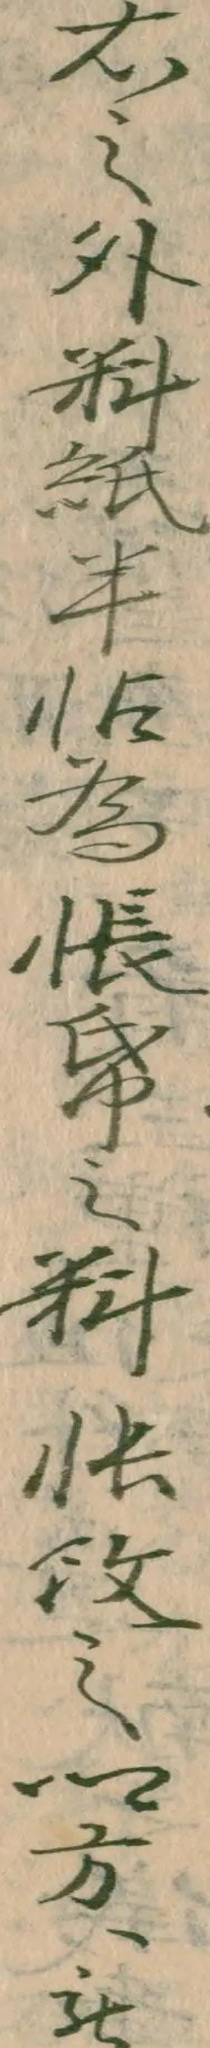右之外料紙半帖為帳紙之料帳紋之郷方へ被
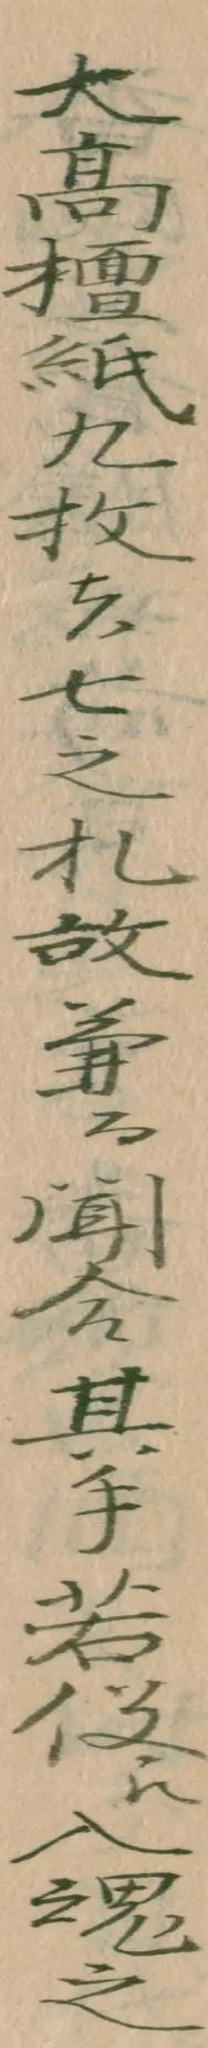一大高檀紙九枚は七之札故兼而聞合其手若役え入魂之
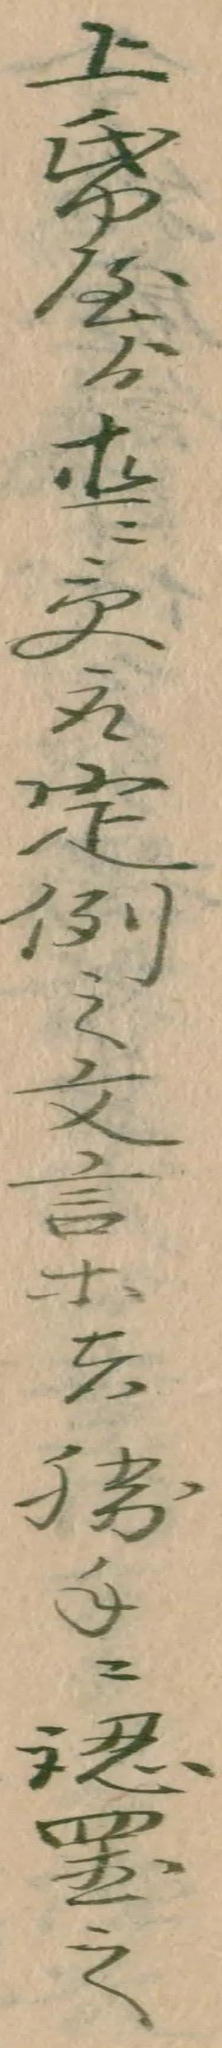上紙屋ゟ直ニ受取定例之文言等は勝手ニ認置之
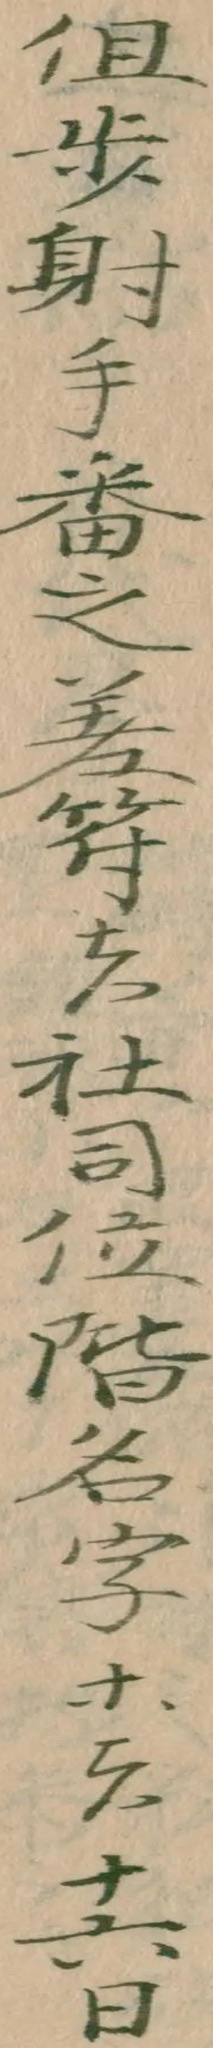但歩射手番之差符は社司位階名字等は十六日
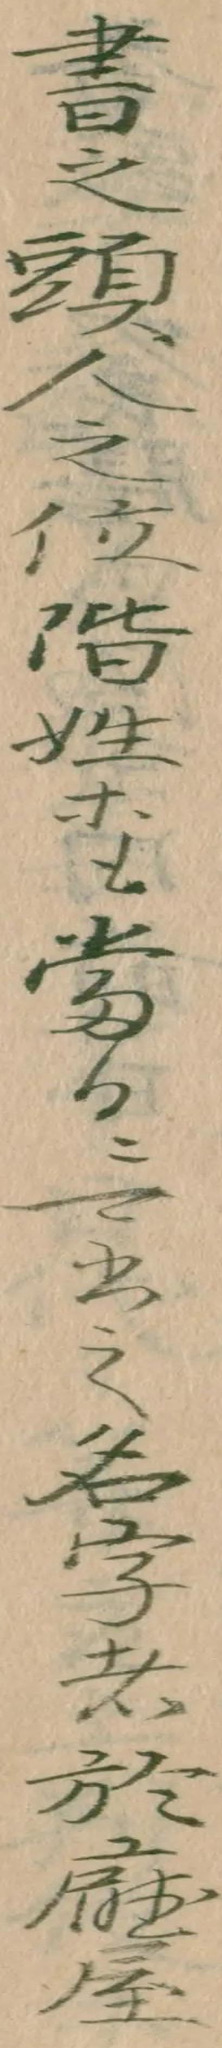書之頭人之位階姓等も当日ニ可出之名字者お庁屋
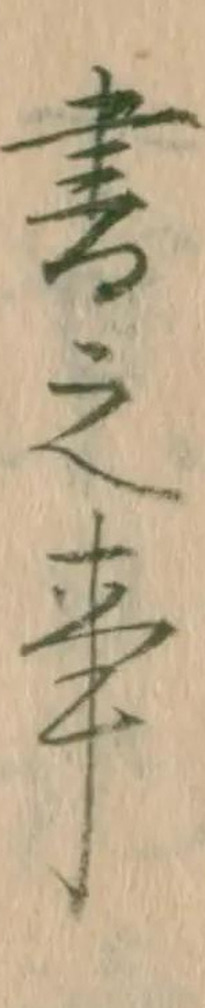書之事
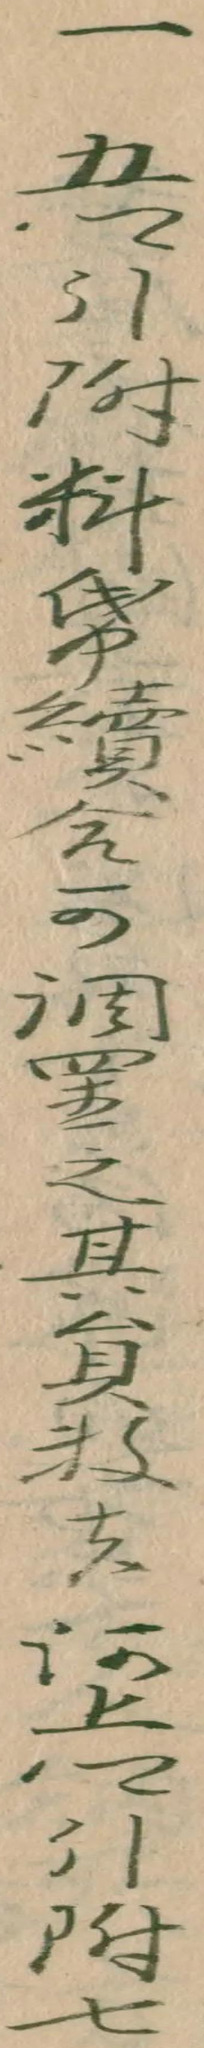一五郷引附料紙続合可調置之其員数は河上郷引附七
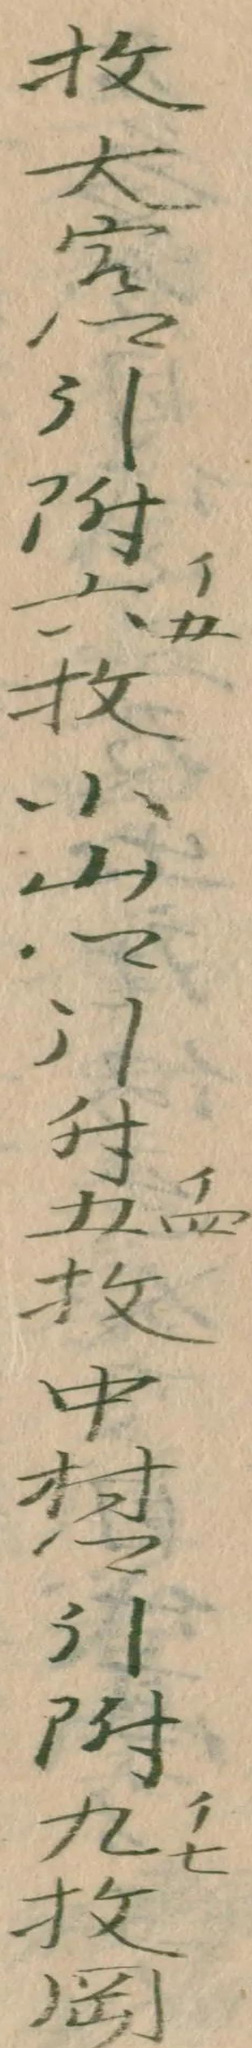枚大宮郷引附六枚小山郷引付五枚中村郷引附九枚岡
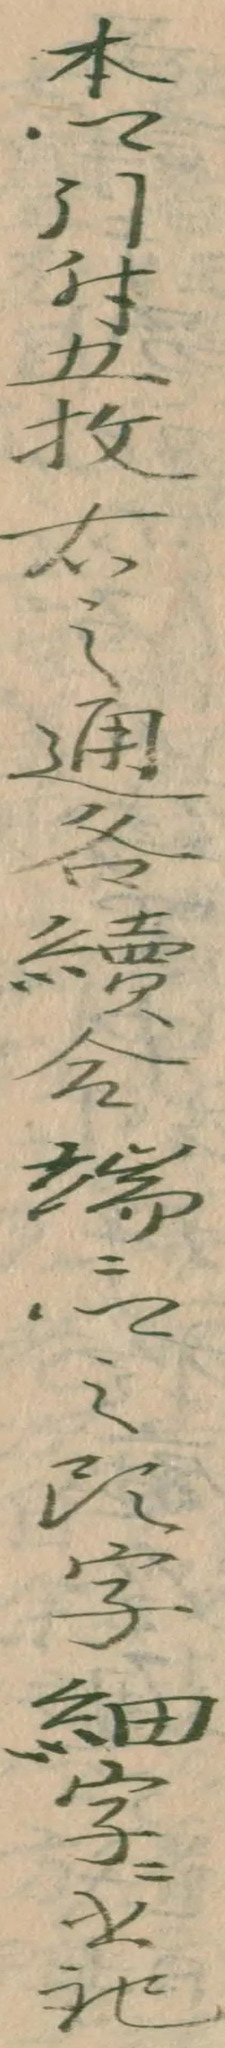本郷引付五枚右之通客続合端ニ郷之頭字細字ニ書記

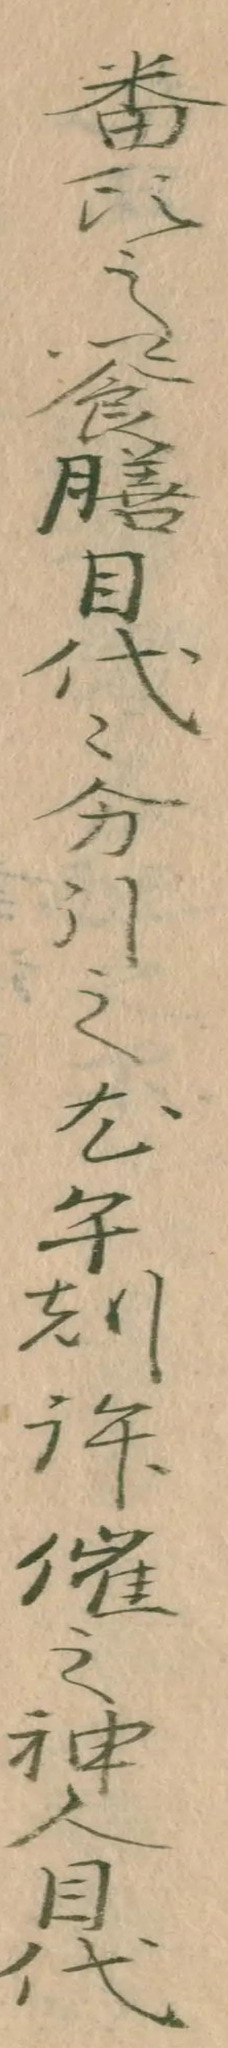一番頭之饗膳目代々分引之尤午刻許催之神人目代
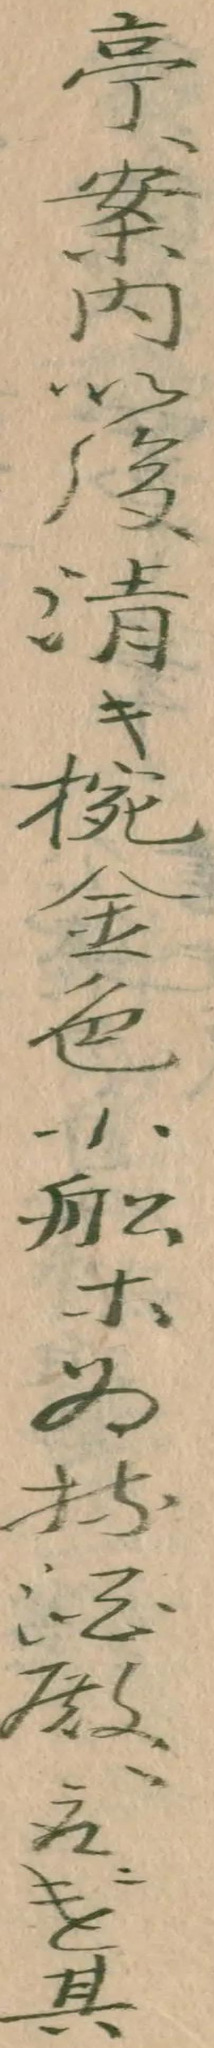亭ヘ案内以後清キ椀金色小船等為持酒殿へ取ニ遣其
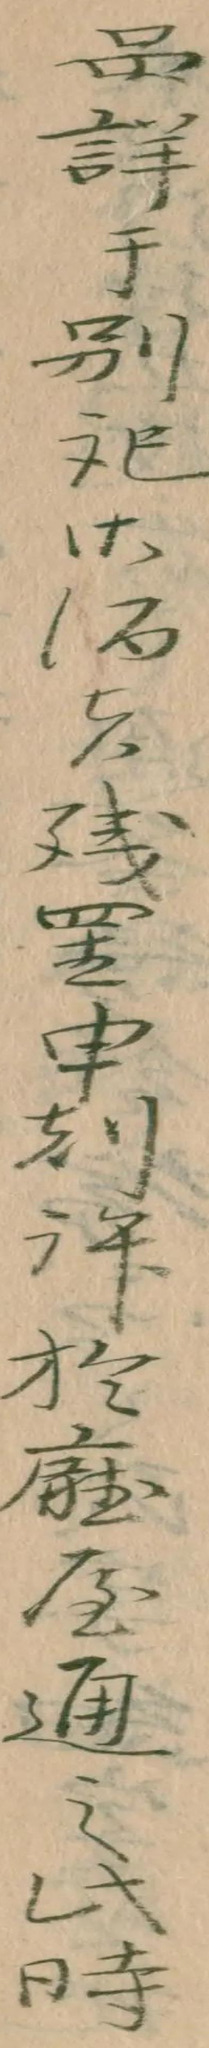品詳于別記御酒は残置申刻許於庁屋通之此時
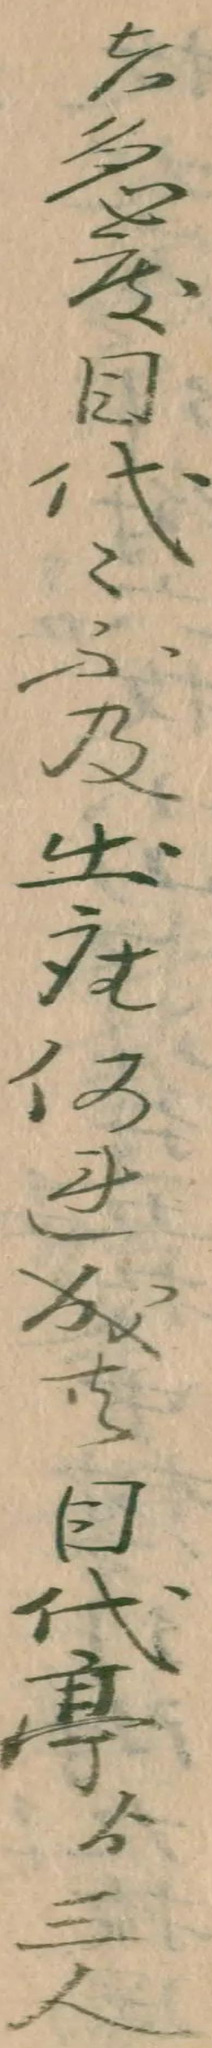は急度目代々不及出座何連成共目代亭ゟ三人
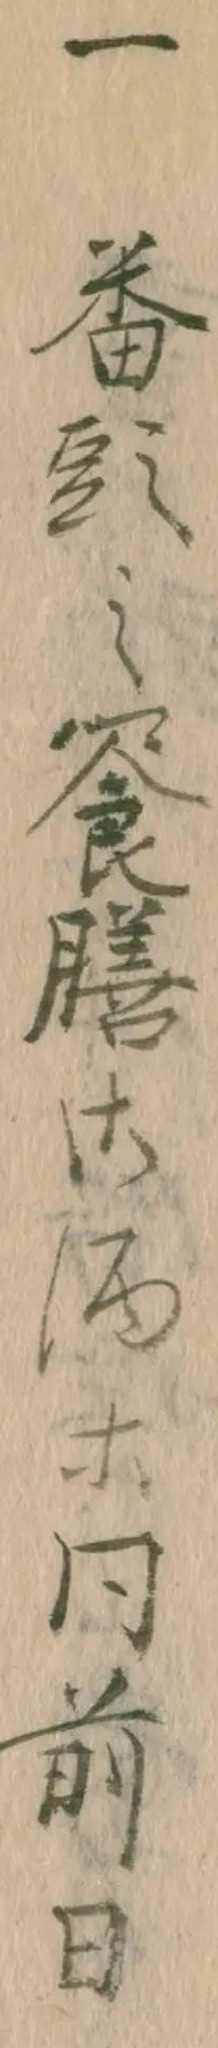一番頭之饗膳御酒等同前日
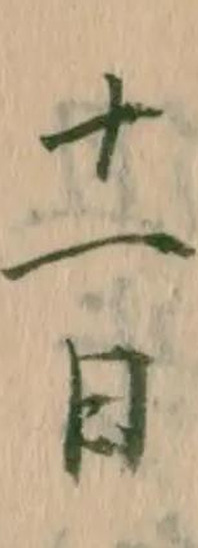十一日
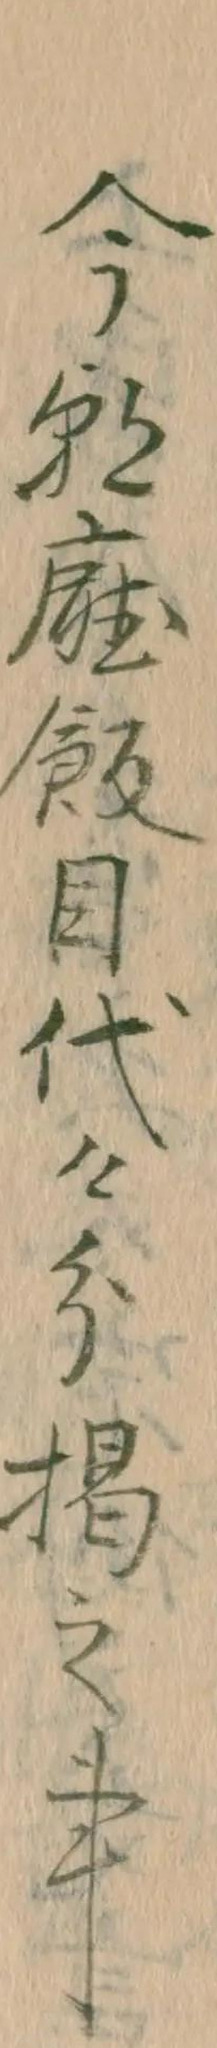一今朝庁飯目代々分掲之事
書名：賀茂社記録. 第26冊
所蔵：国立国会図書館 National Diet Library, JAPAN
